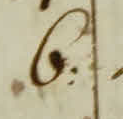6:
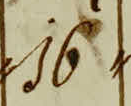16
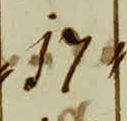17
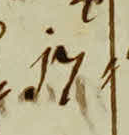17
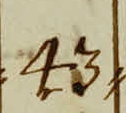43
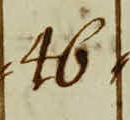46
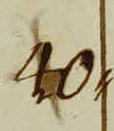40
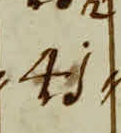41
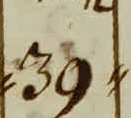39
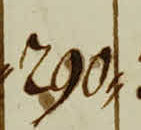290
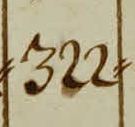322
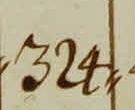324
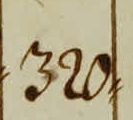320
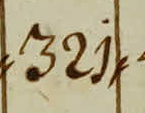321
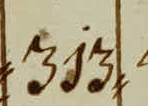313
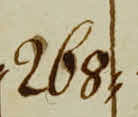268
